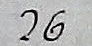26
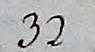32
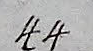44
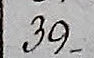39
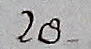28
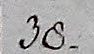38
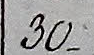30
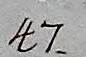47
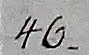46
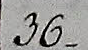36
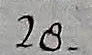28
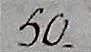50
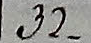32
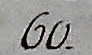60
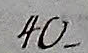40
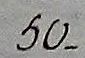50
